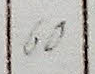60
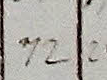72
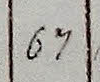67
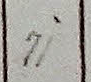71
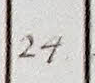24
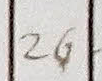26
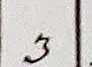3
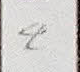4
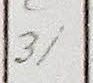31
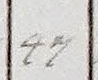47
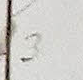3
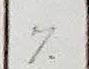7.
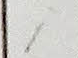1
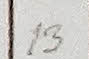13
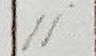11
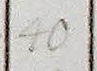40
